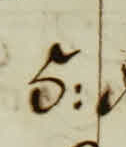5:
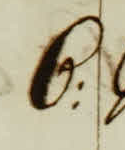6:
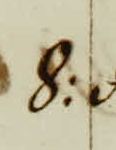8:
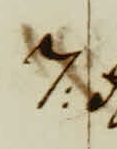7:
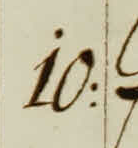10:
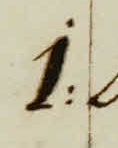1:
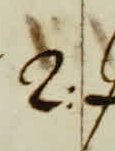2:
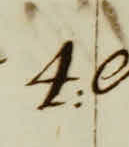4:
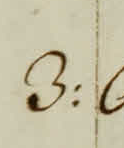3:
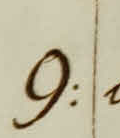9:
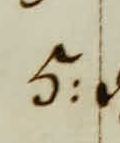5:
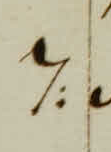7:
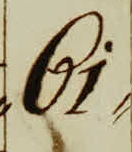61
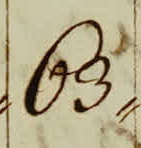63
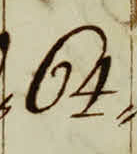64
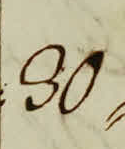30
